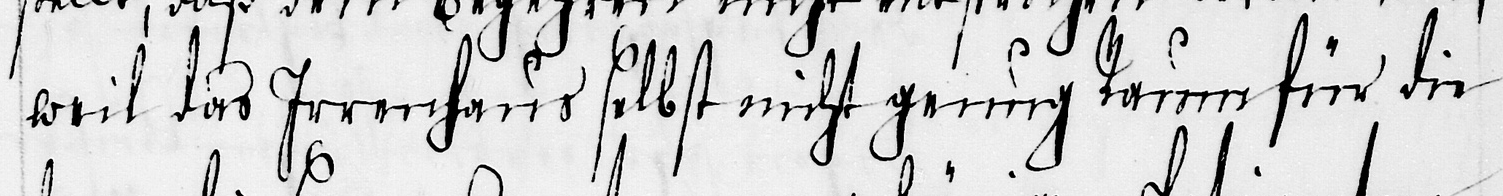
weil das Irrenhaus selbst nicht genug Raum für die
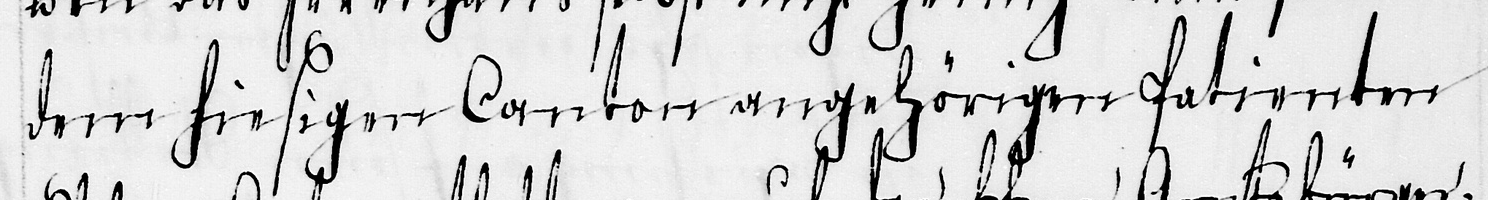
dem hiesigen Canton angehörigen Patienten
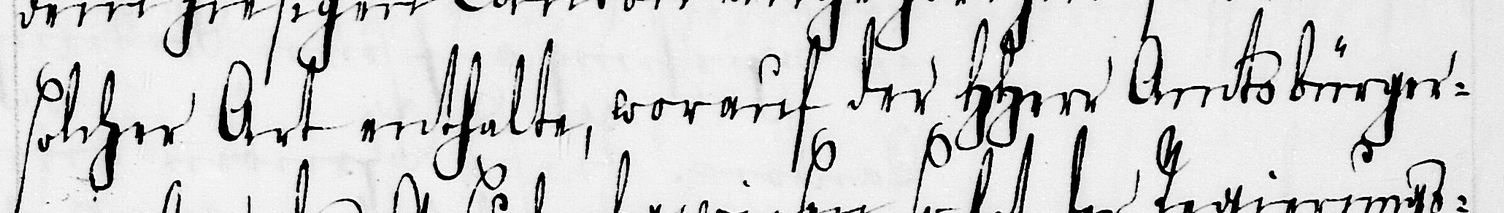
solcher Art enthalte, worauf der HHerr Amtsbürger¬
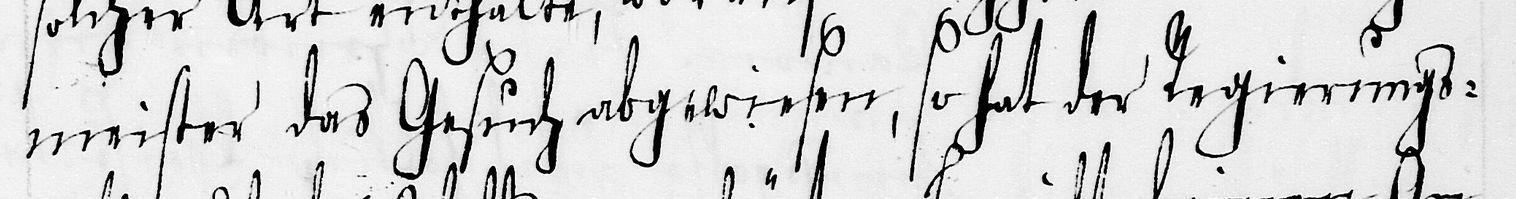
meister das Gesuch abgewiesen, so hat der Regierungs¬
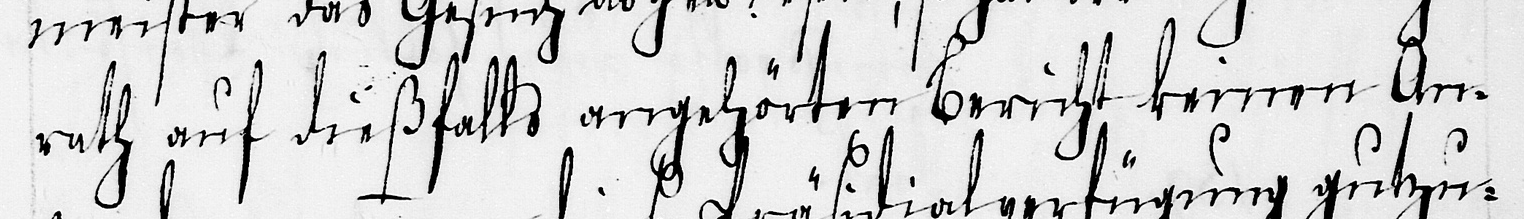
rath auf dießfalls angehörten Bericht keinen An¬
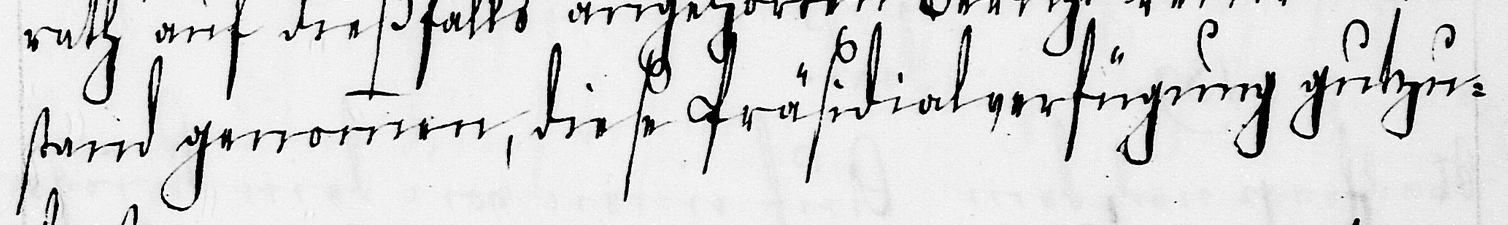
stand genommen, diese Präsidialverfügung gutzu¬
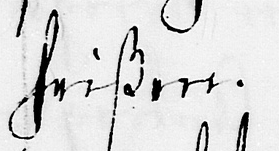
heißen.
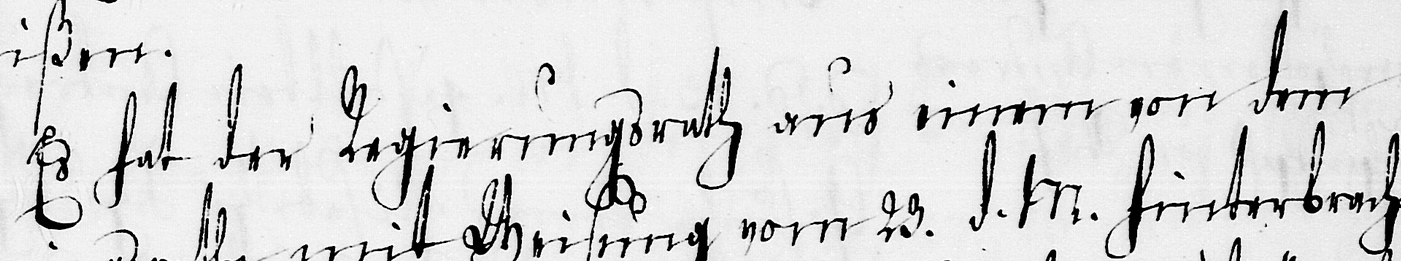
Es hat der Regierungsrath aus einem von dem
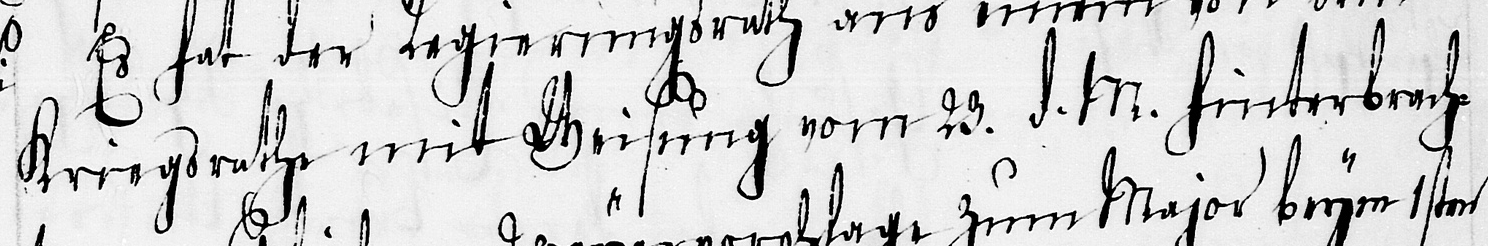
Kriegsrathe mit Weisung vom 23. d. M. hinterbrach¬
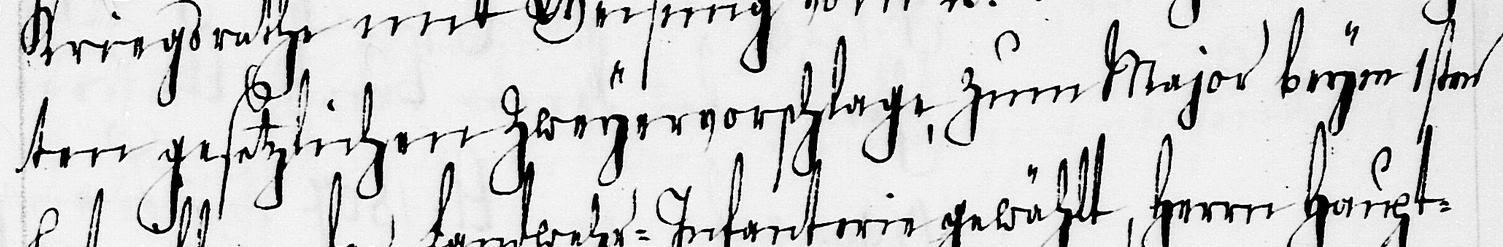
ten gesetzlichen Zweyervorschlage, zum Major beym 1sten
